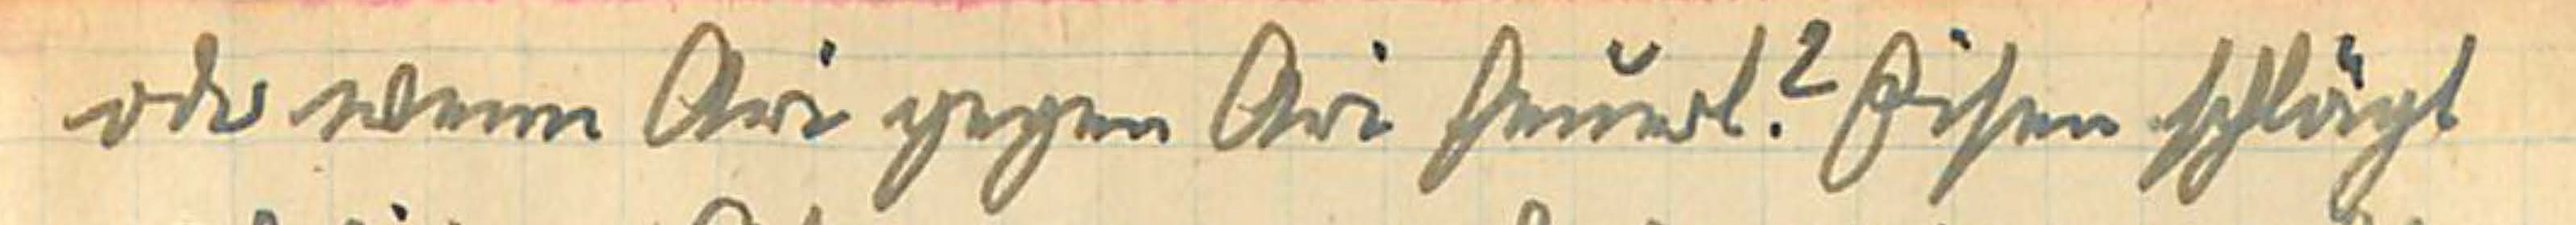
oder wenn Ari gegen Ari feuert? Eisen schlägt
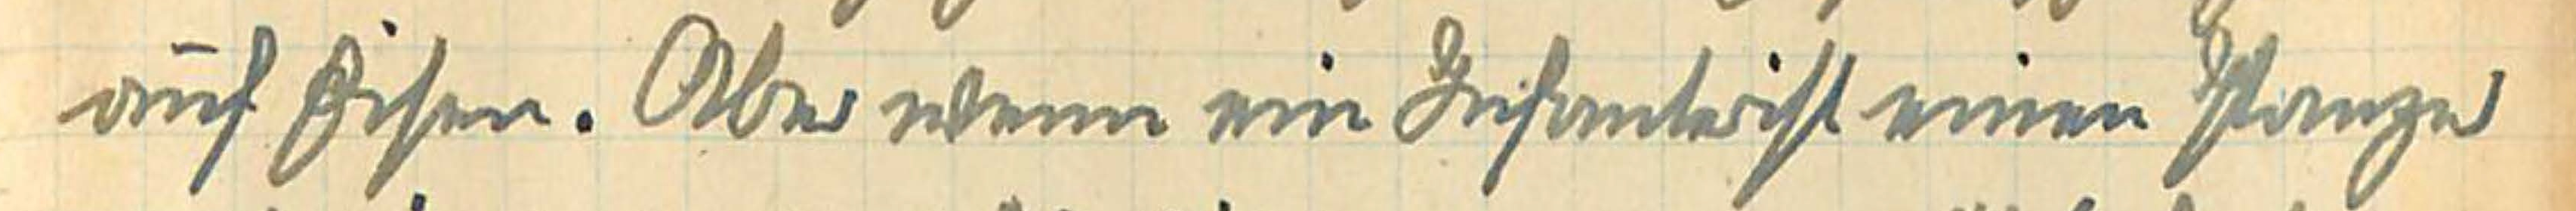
auf Eisen. Aber wenn ein Infanterist einen Panzer
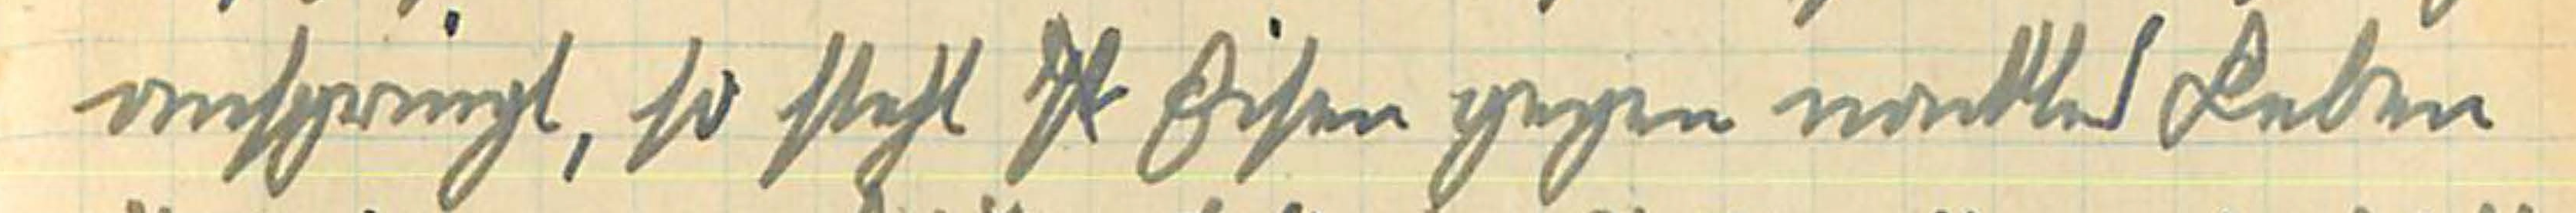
anspringt, so steht P Eisen gegen nacktes Leben
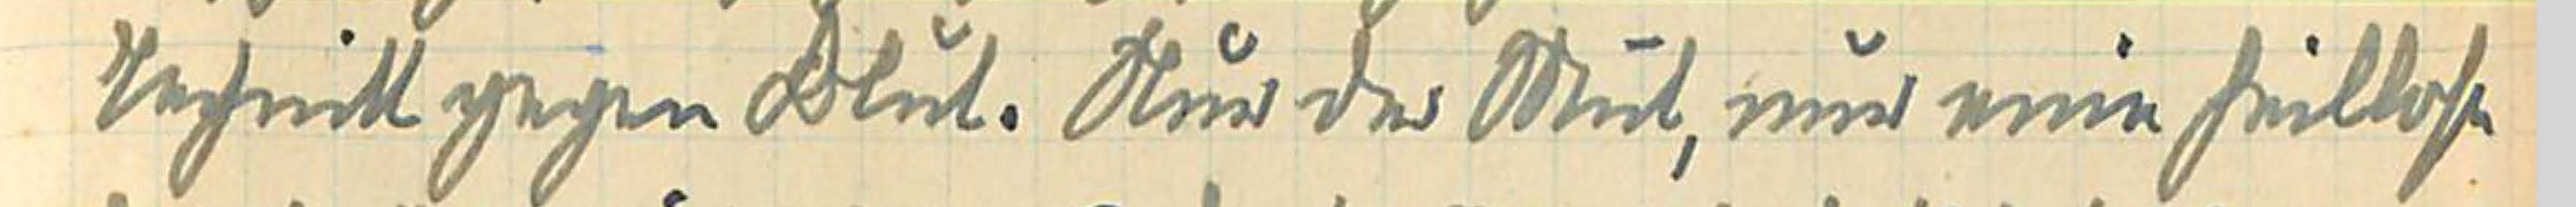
Technik gegen Blut. Nur der Mut, nur eine heillose
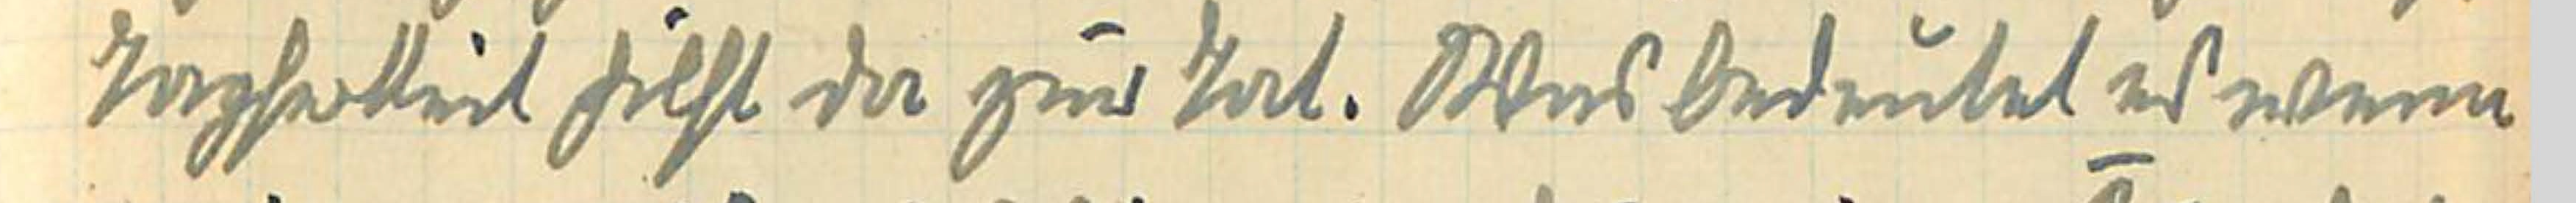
Tapferkeit hilft da zur Tat. Was bedeutet es wenn
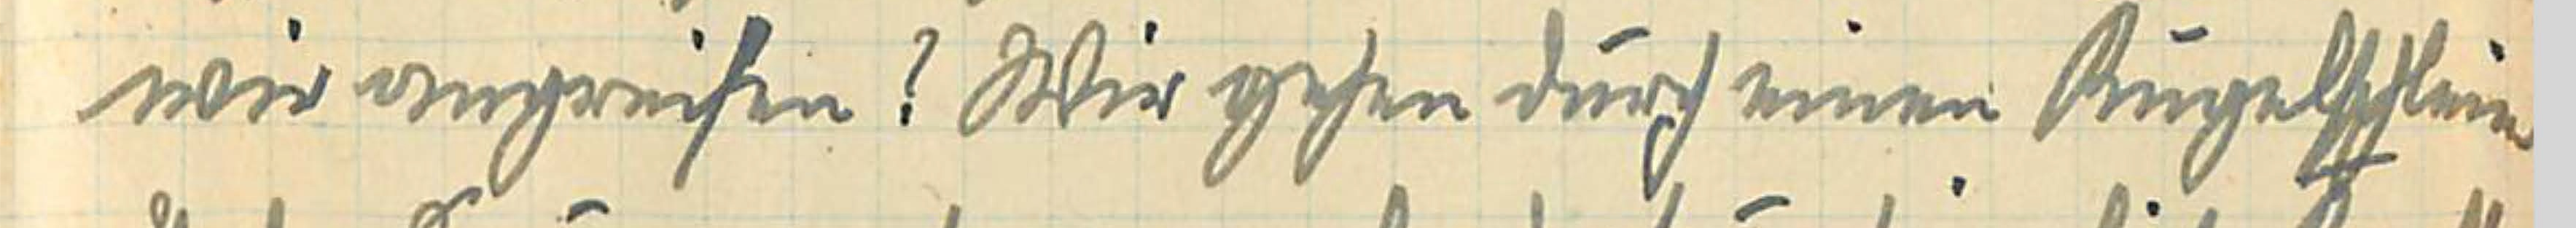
wir angreifen? Wir gehen durch einen Kugelschleier.
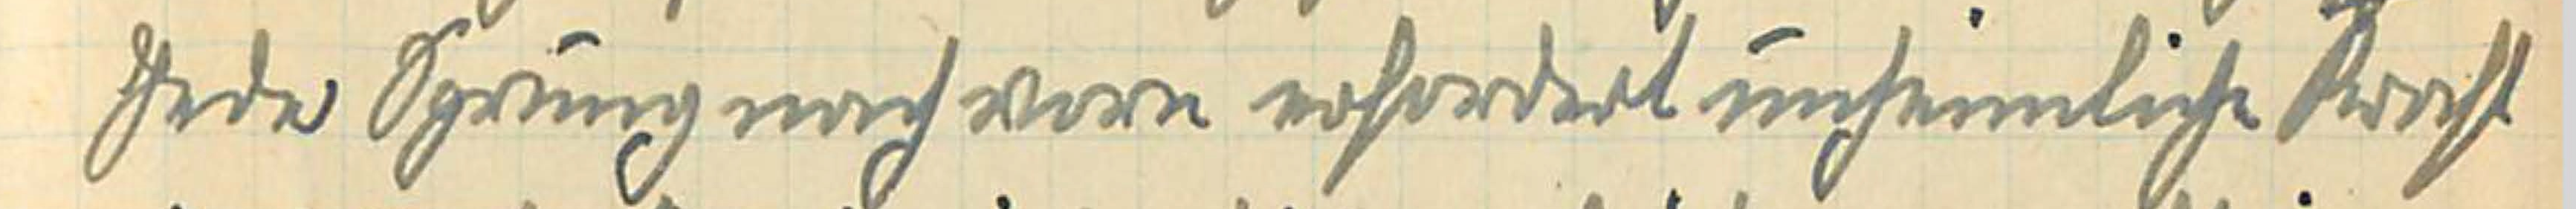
Jeder Sprung nach vorn erfordert unheimliche Kraft
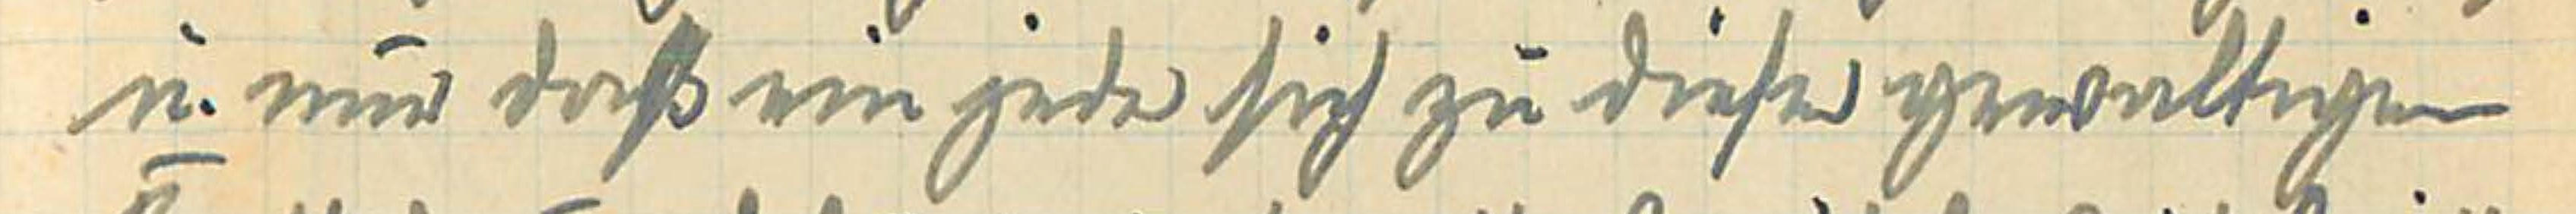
u. nur daß ein jeder sich zu dieser gewaltigen
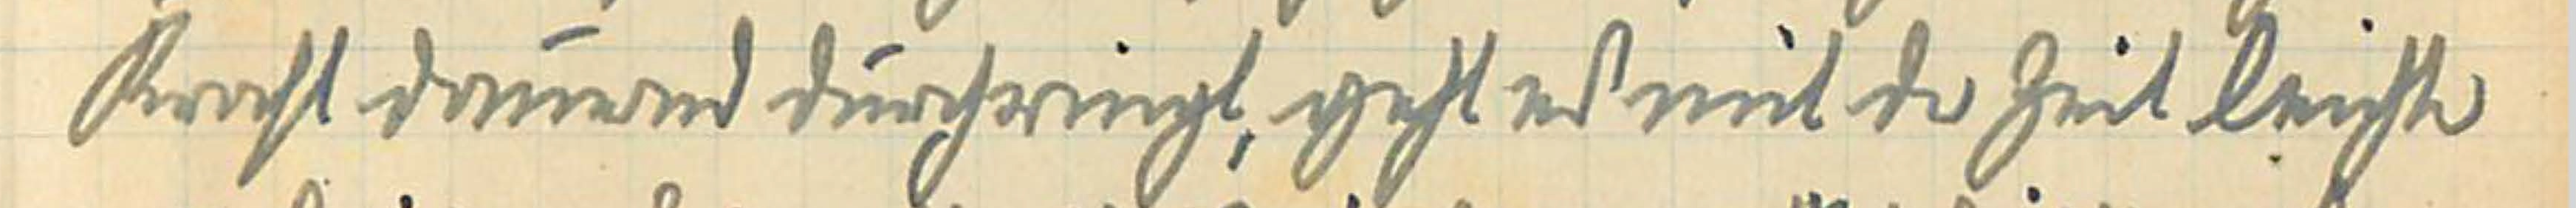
Kraft dauernd durchringt, geht es mit der Zeit leichter
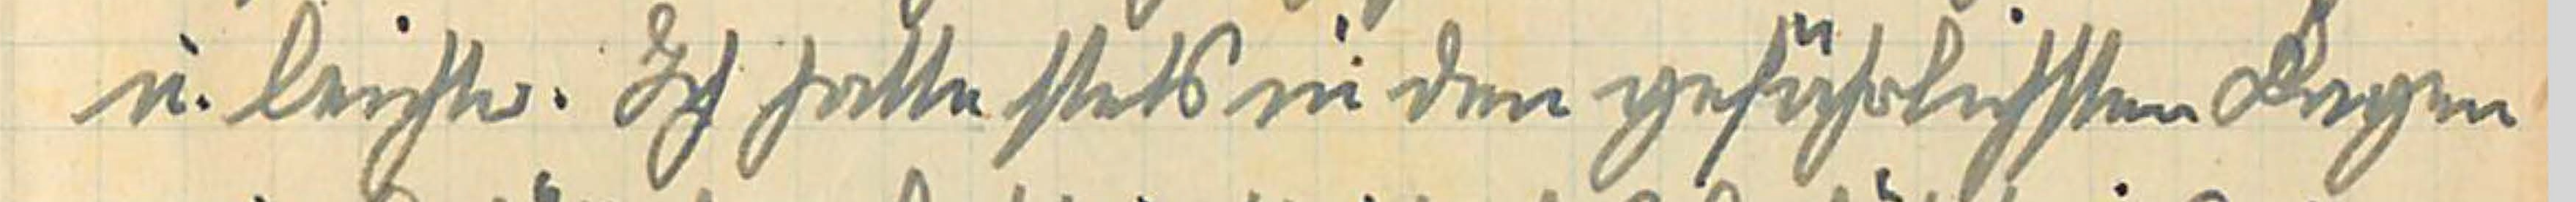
u. leichter. Ich hatte stets in den gefährlichsten Lagen
